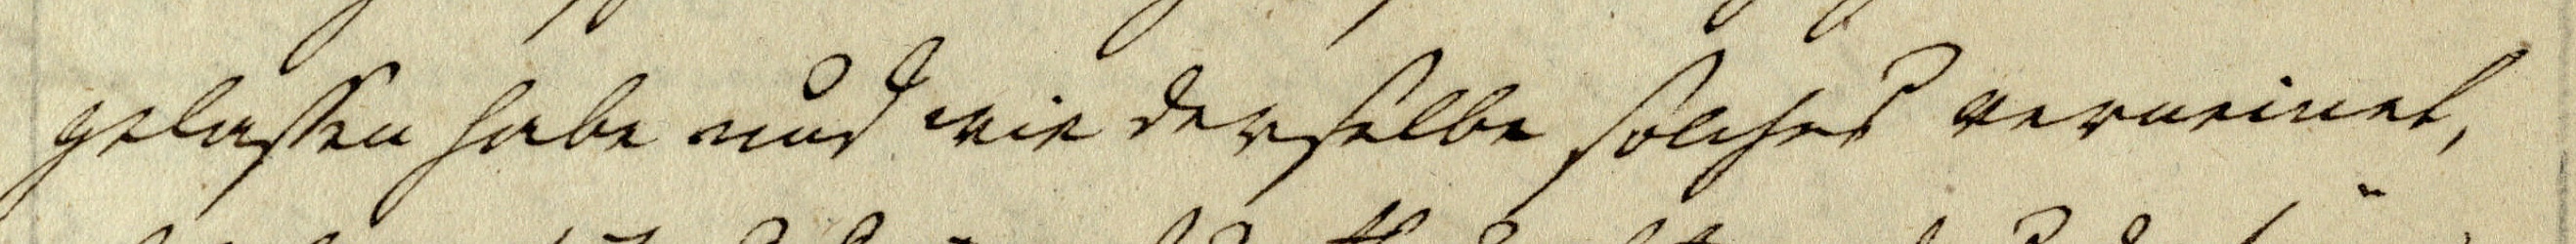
gelassen habe und wie derselbe solches verneinet,
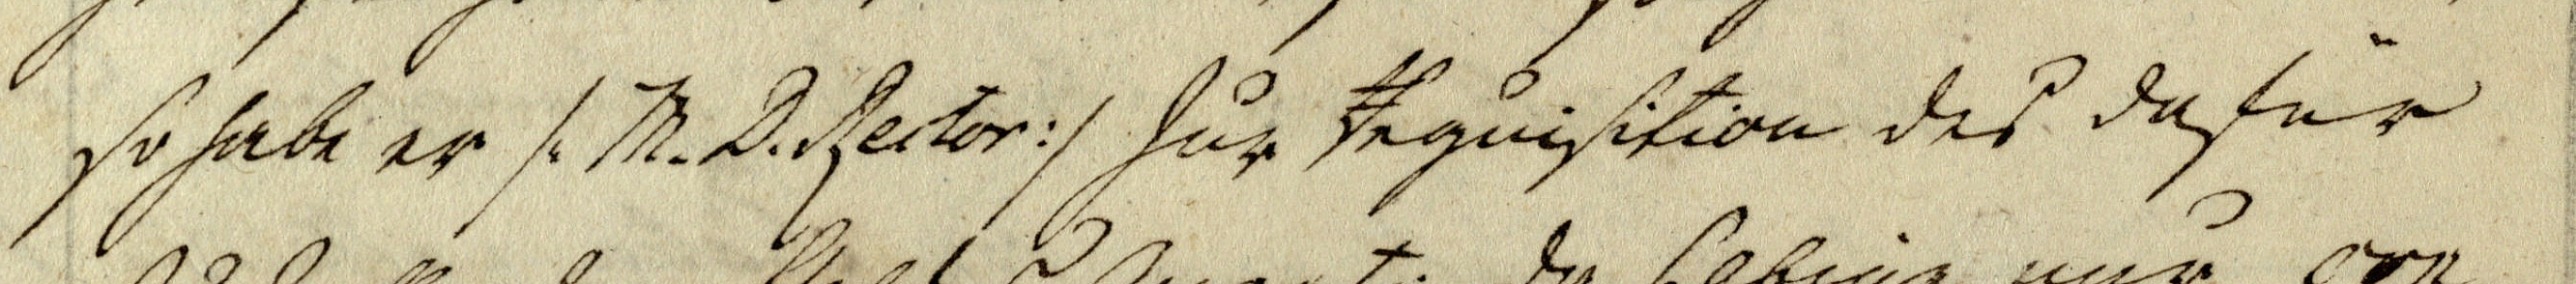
so habe er /. M. D. Rector :/ zur Requisition der dafür
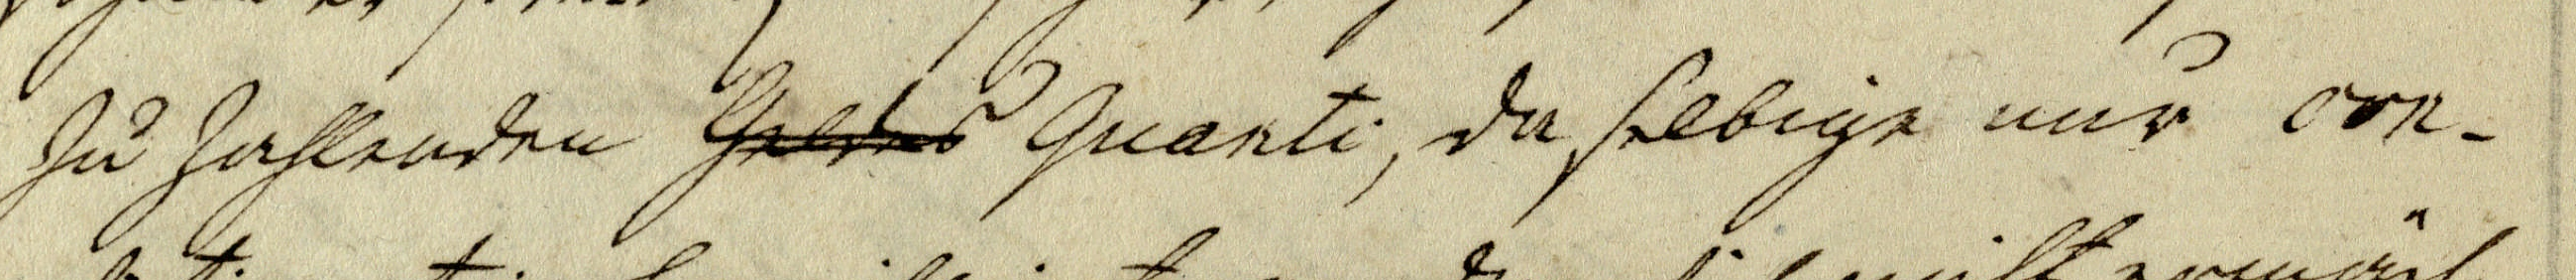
zu zahlenden Gelder Quanti, da selbige nur con¬
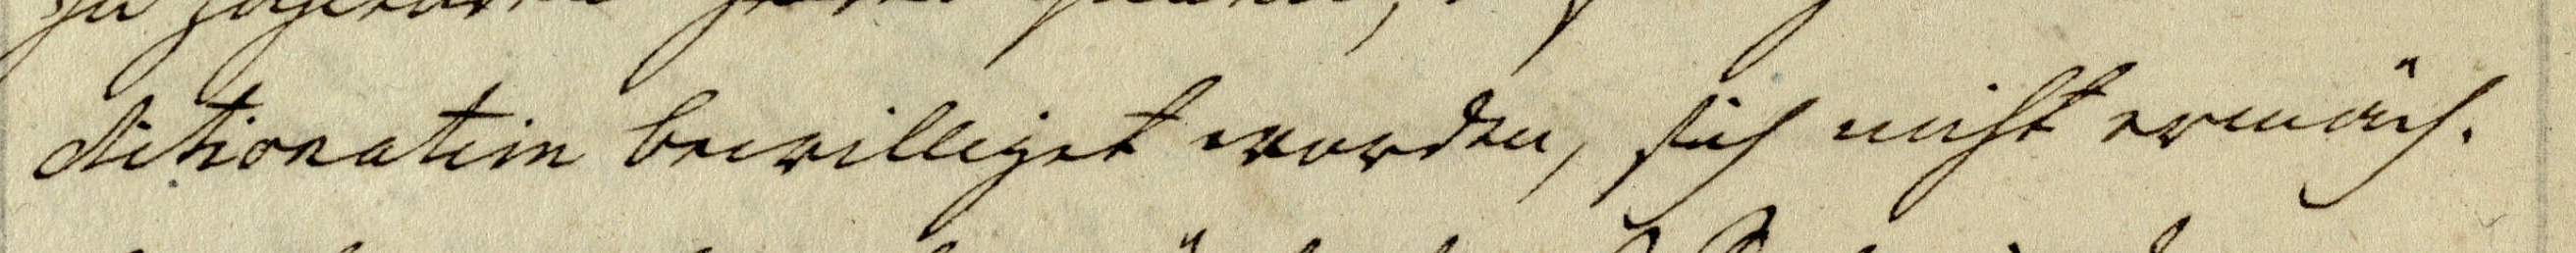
ditionatien bewilligt worden, sich nicht ermäch¬
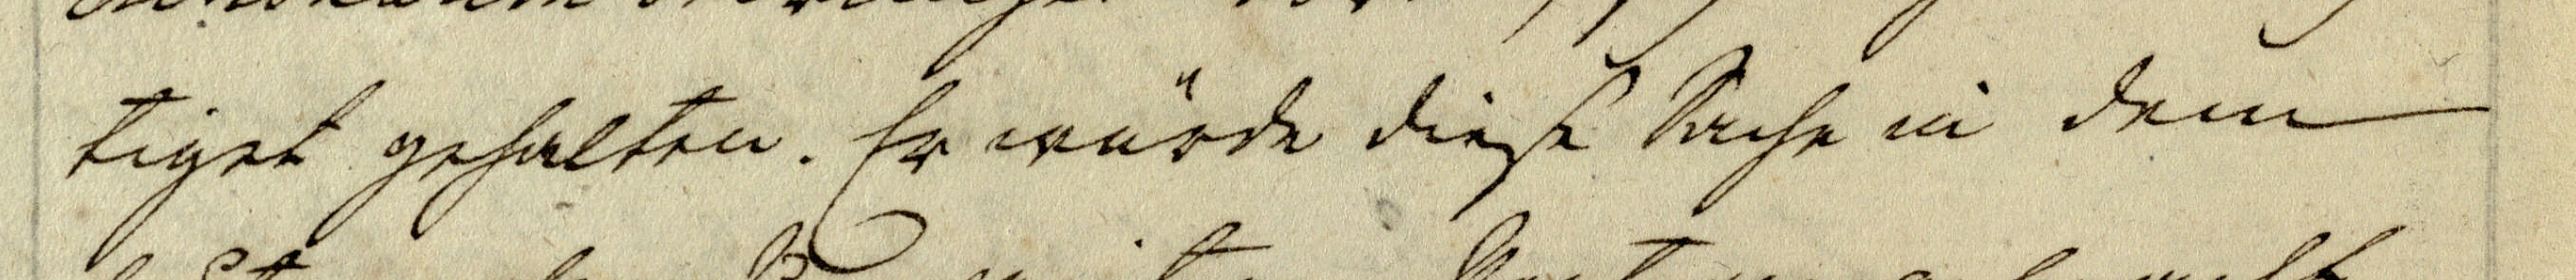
tiget gehalten. Er würde diese Sache in dem
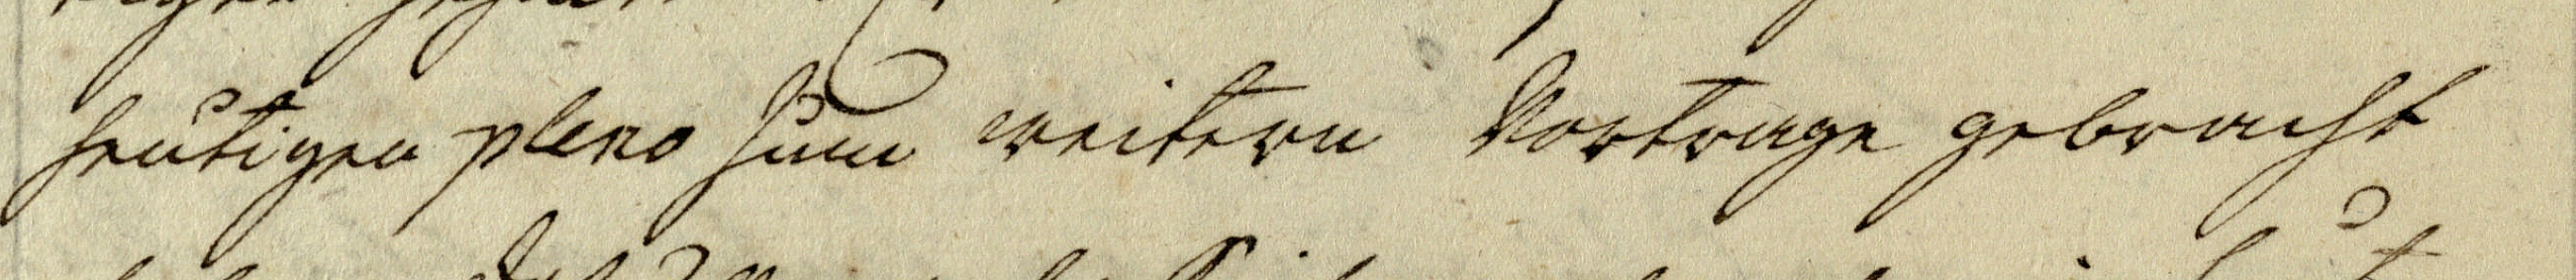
heutigen pleno zum weitern Vortrage gebracht
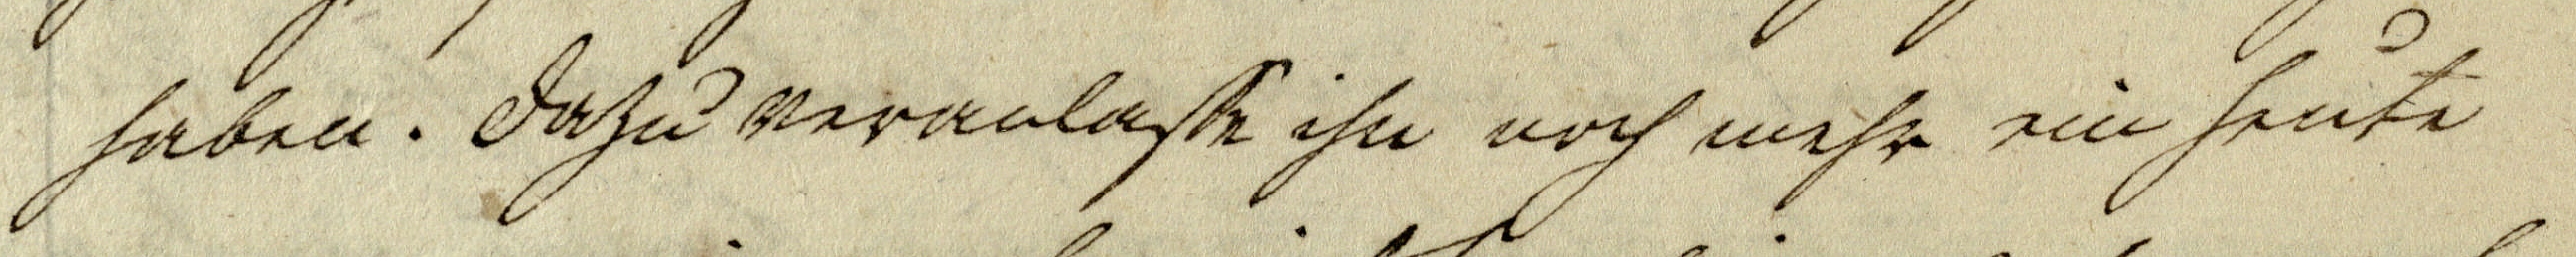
haben. Dazu veranlasse ihn noch mehr ein heute
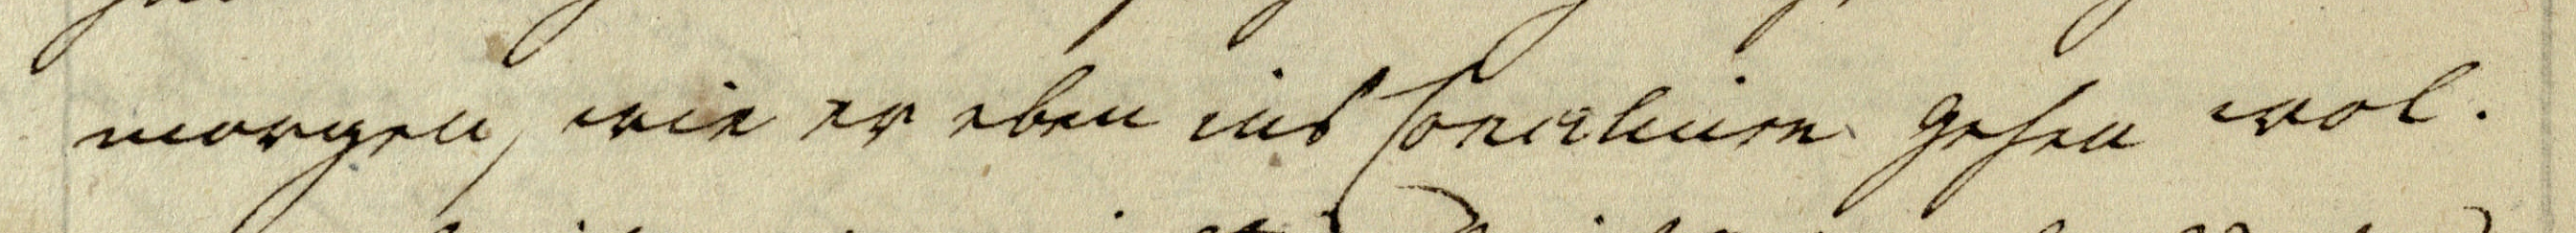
morgen, wie er eben aus Concilium gehen wol¬
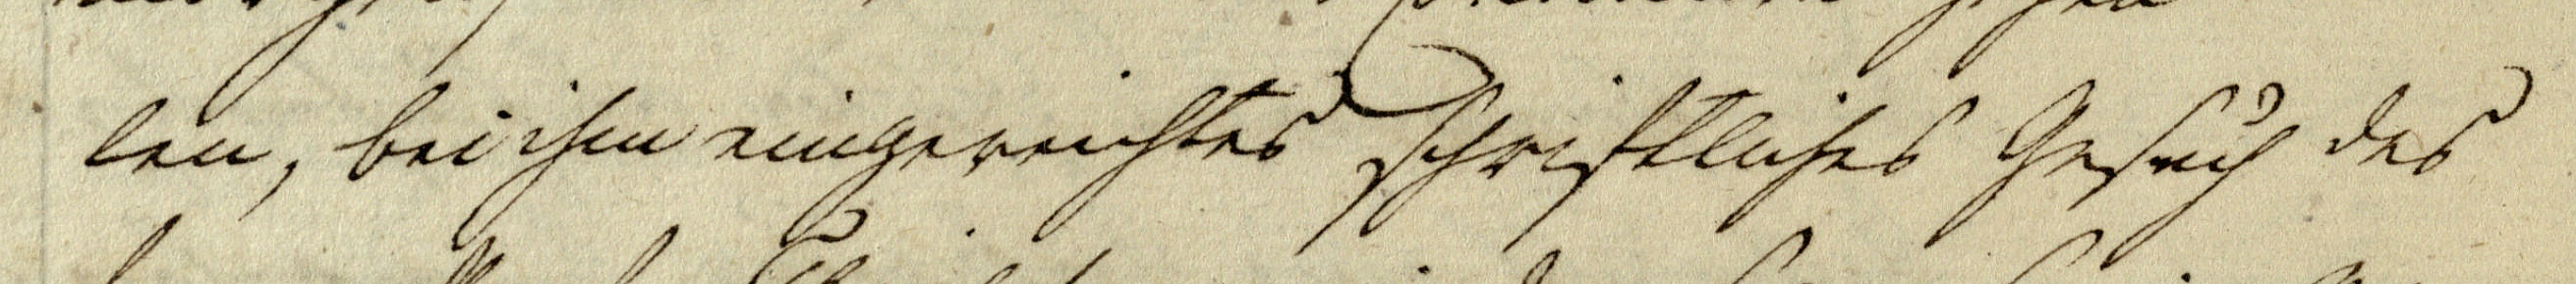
len, bei ihm eingereichtes schriftliches Gesuch des
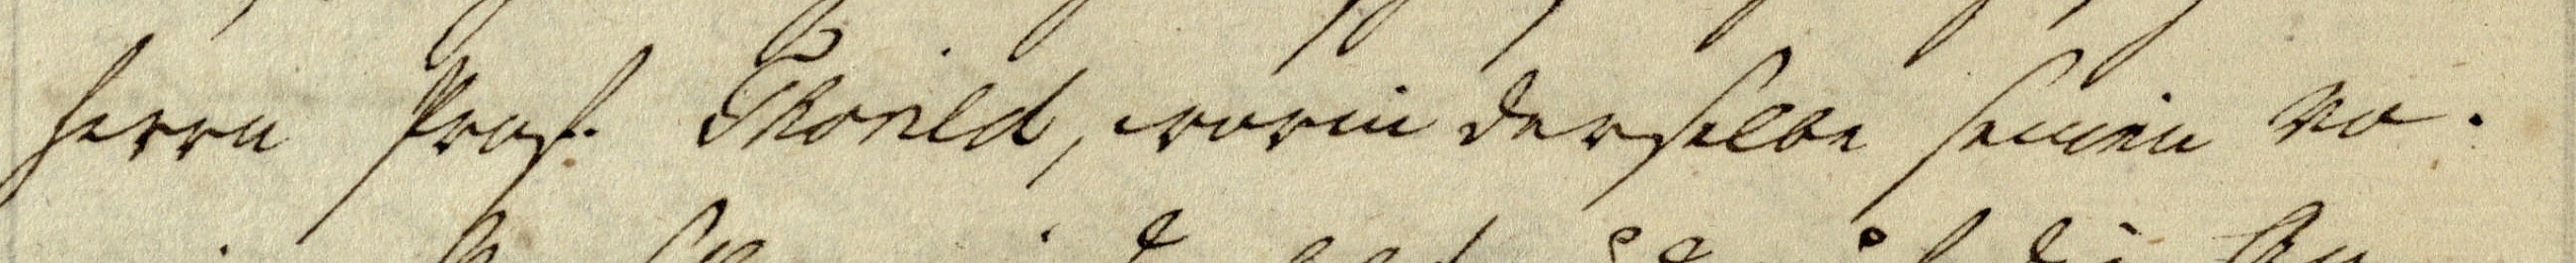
Herrn Prof. Thorild, worin derselbe seinen vo¬
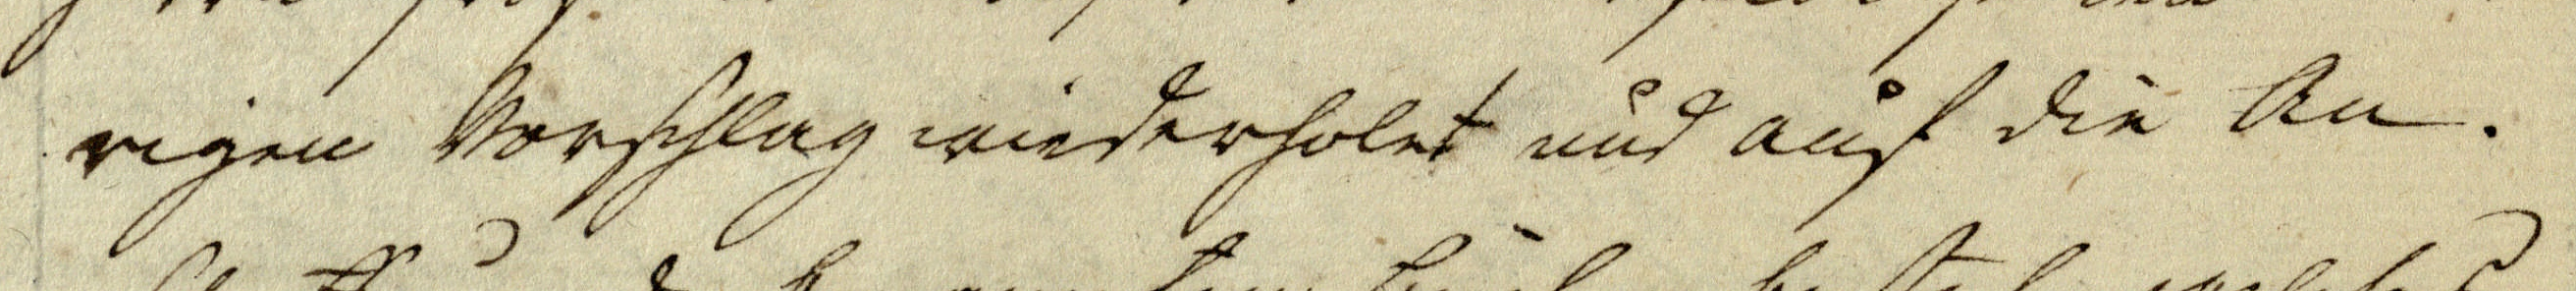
rigen Vorschlag wiederholet und auf die An¬
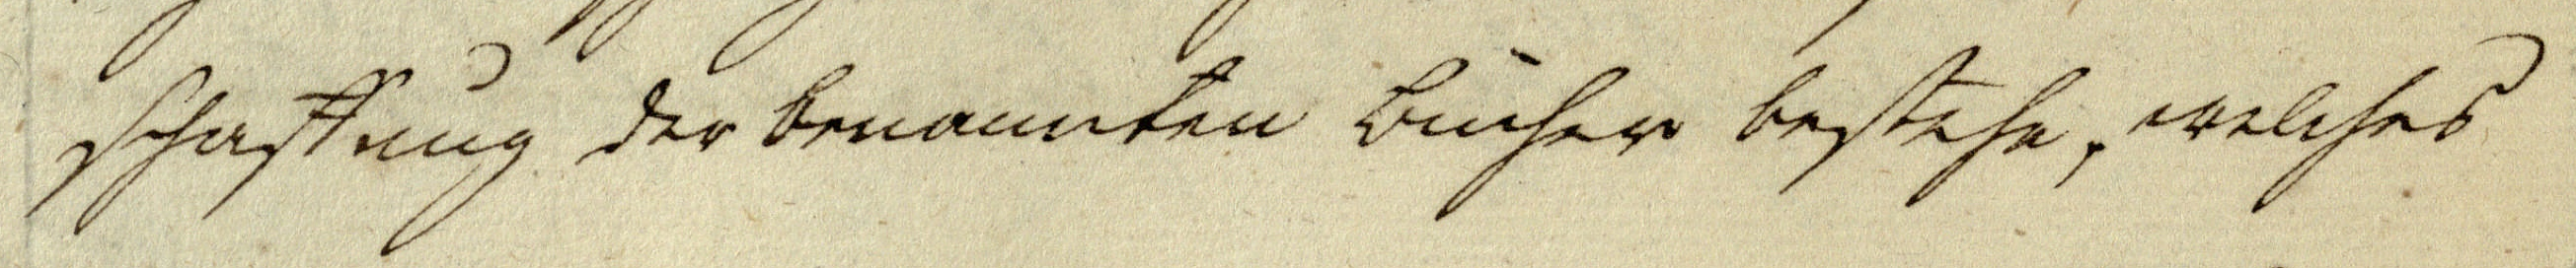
schaffung der benannten Bücher bestehe, welches
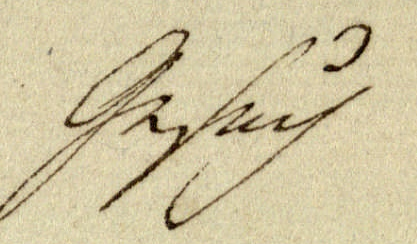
Gesuch
